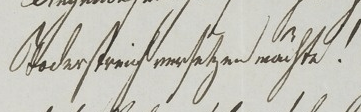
versetzen möchte!
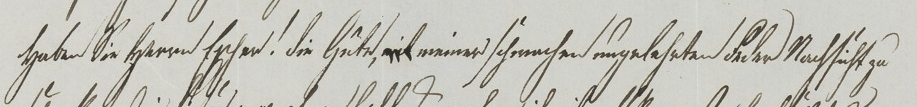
die Güte, ... meiner schwachen ungelehrten Feder Nachsicht
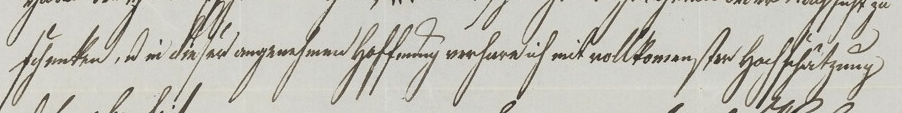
schenken, u in dieser angenehmen Hoffnung verhare
